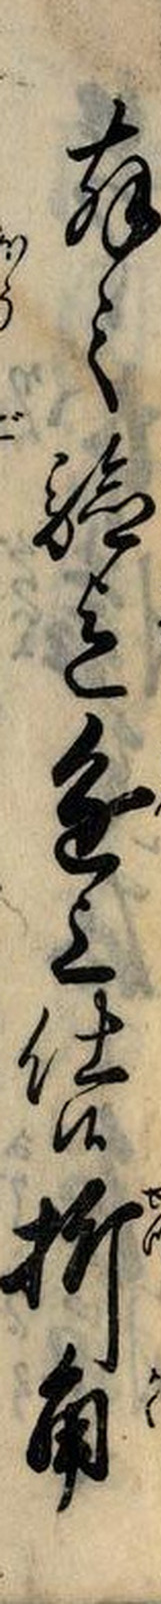舞之験迄進上仕候折角
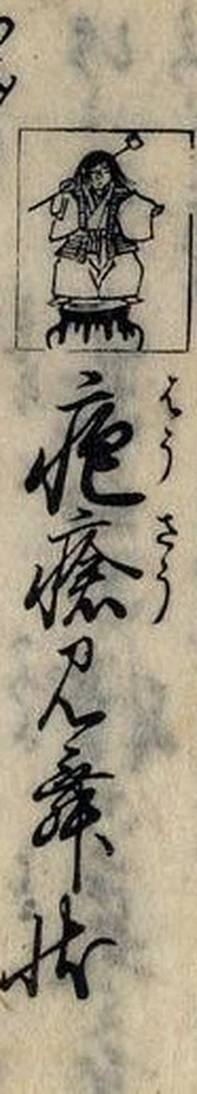疱瘡見舞状
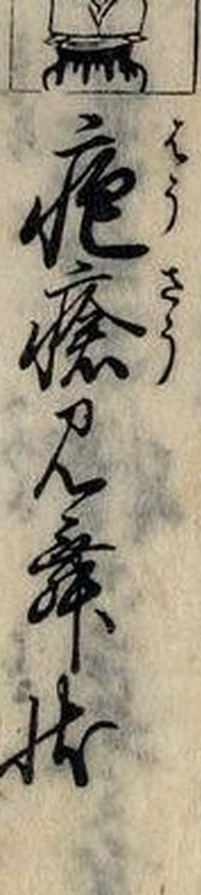疱瘡見舞状
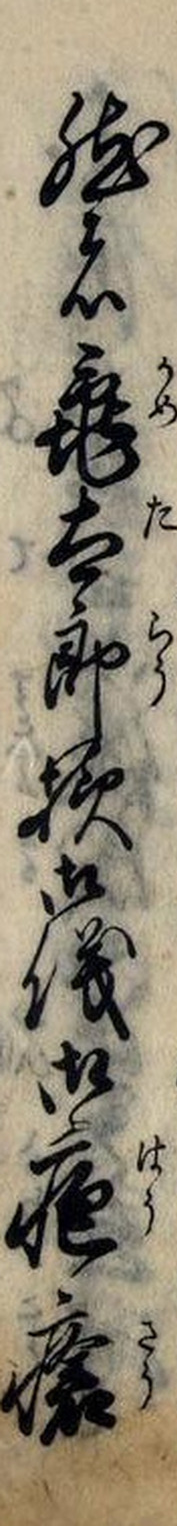然者亀太郎様御儀御疱瘡

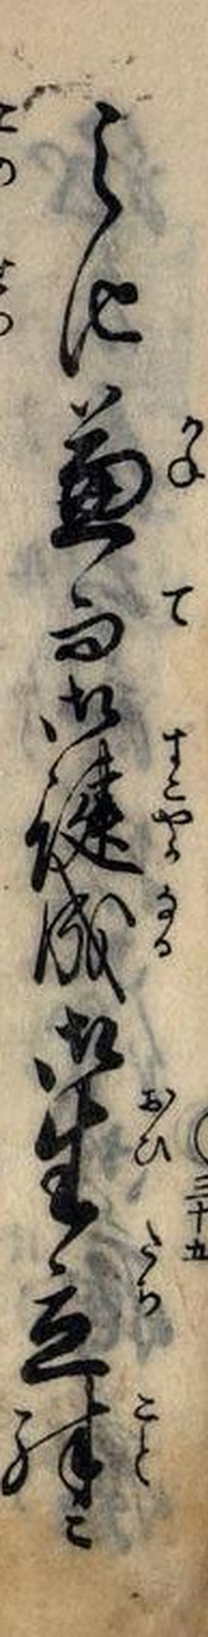之由兼而御健成御生立殊に
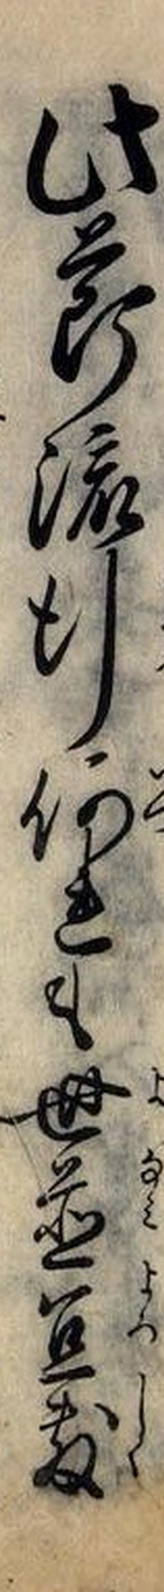此節流行何れも世並宜敷
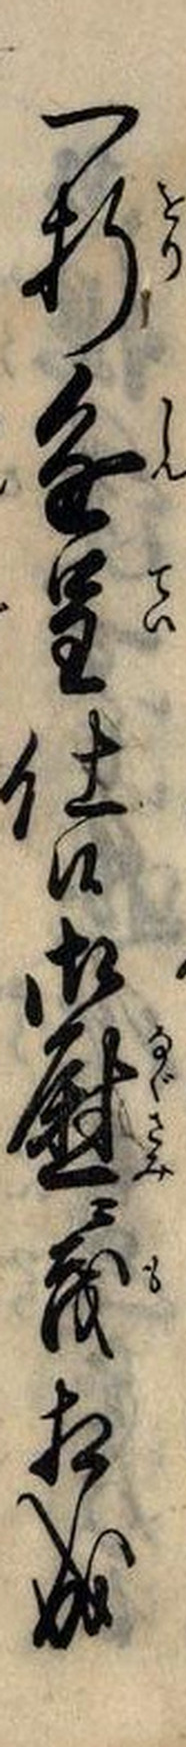一折進呈仕候御慰にも相成
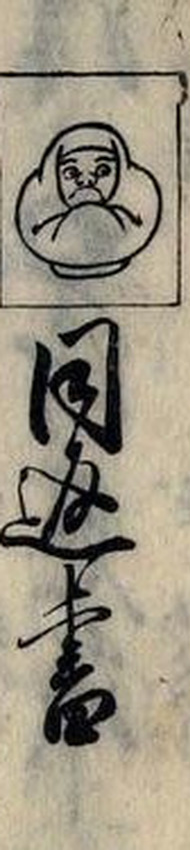同返書
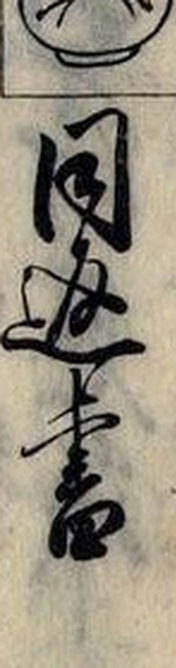同返書
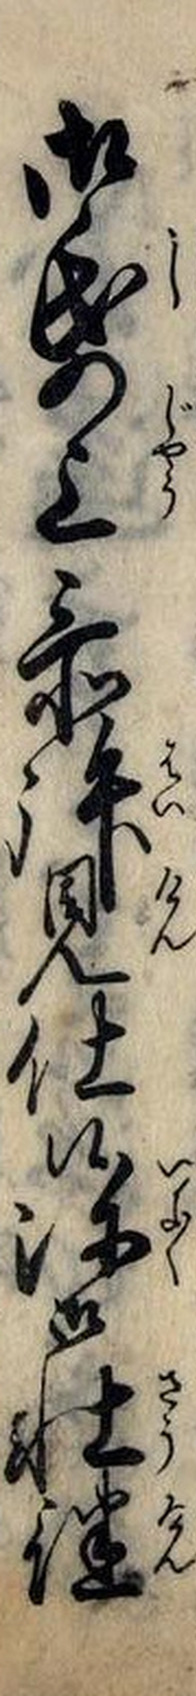御紙上忝拝見仕候弥御壮健

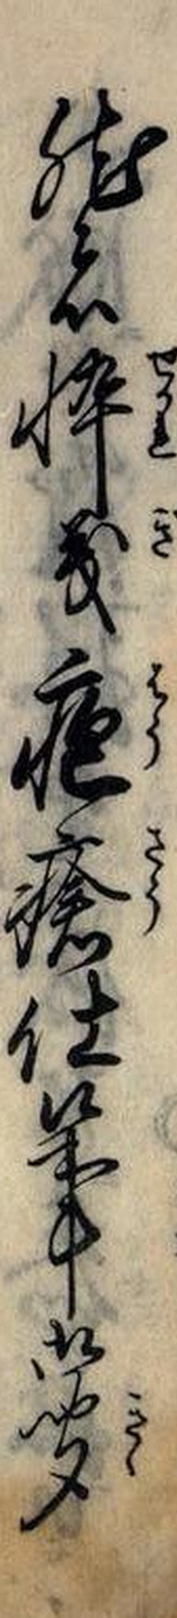然者忰義疱瘡仕候事御聞
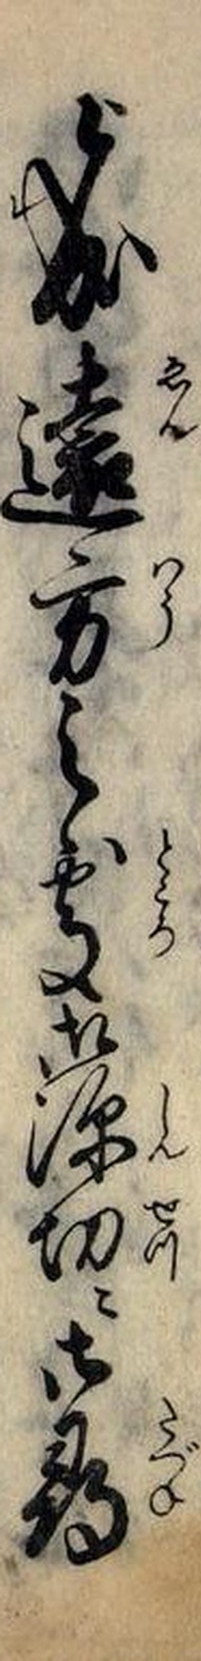被成遠方之處御深切に御尋
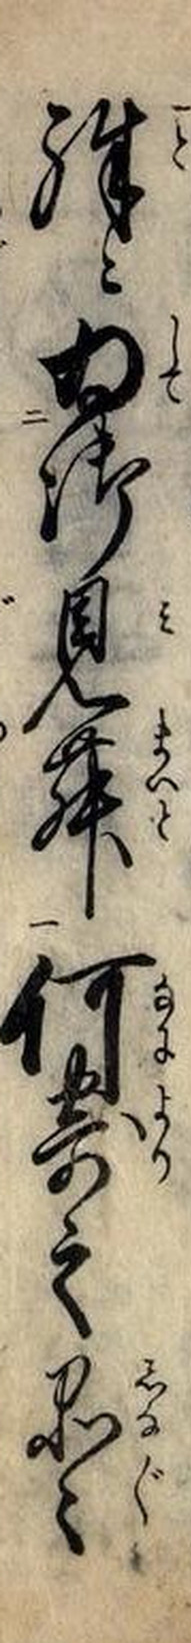殊に為御見舞何寄之品々
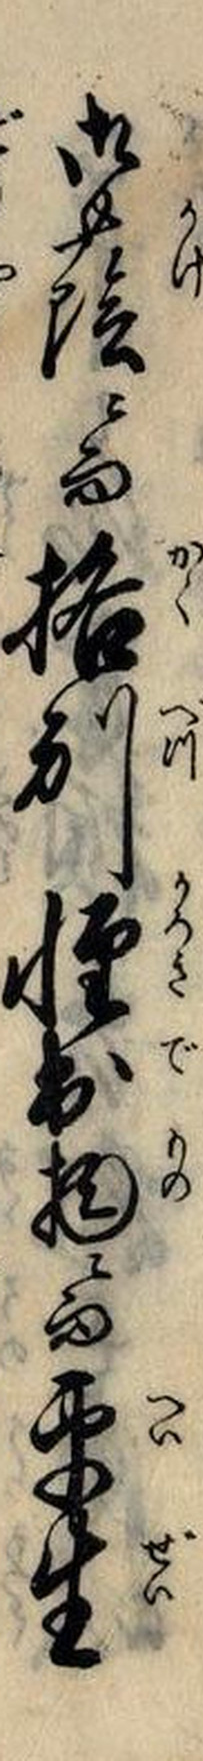御蔭に而格別軽出物に而平生
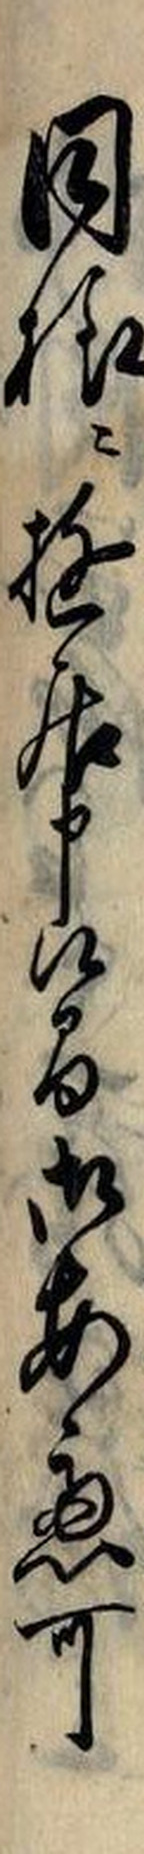同様に遊居申候間御安慮可
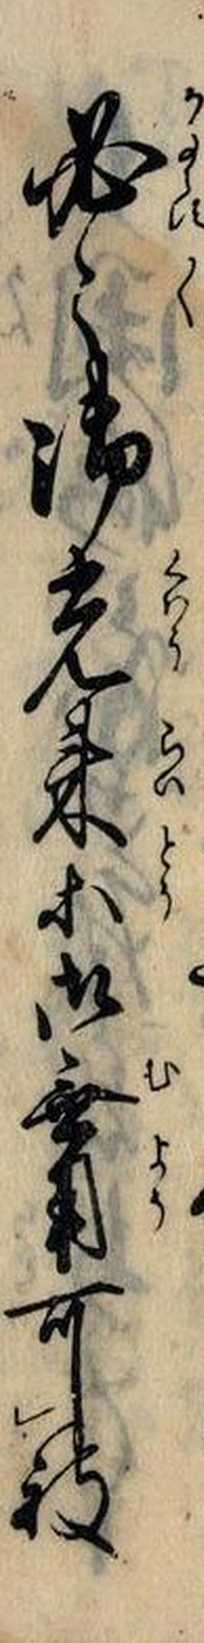必々御光来等御無用可被
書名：大成用文章（往来物）
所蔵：福井県文書館 Fukui Prefectural Archives
